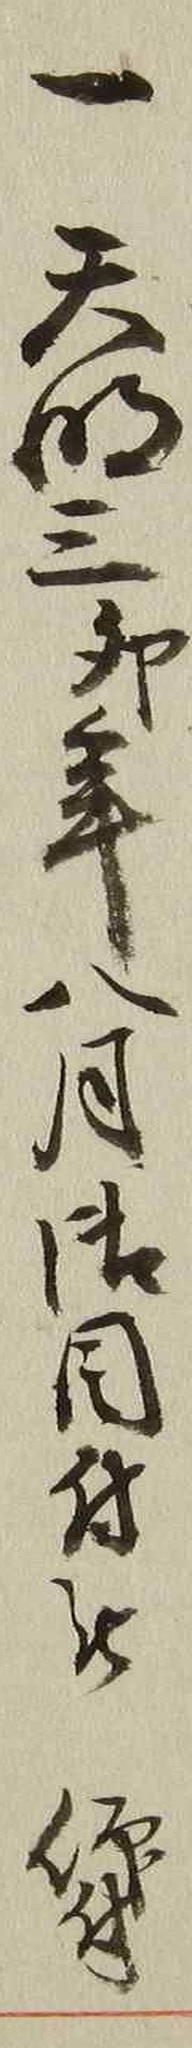一天明三卯年八月御目付被仰付
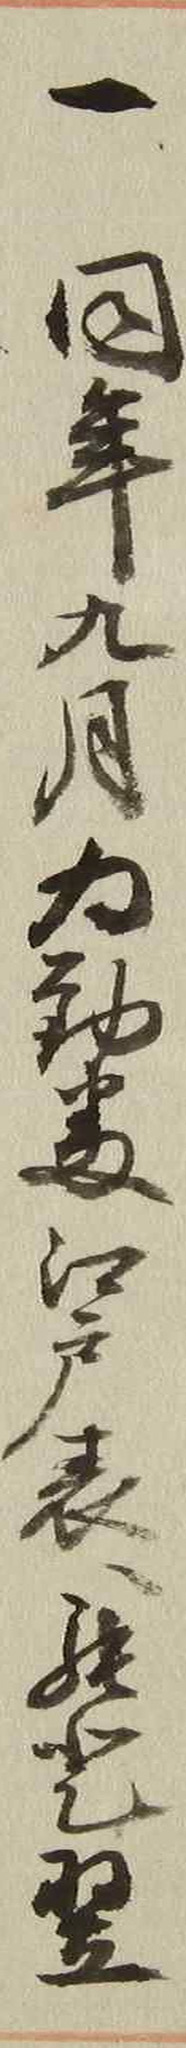一同年九月為勤番江戸表へ罷登翌
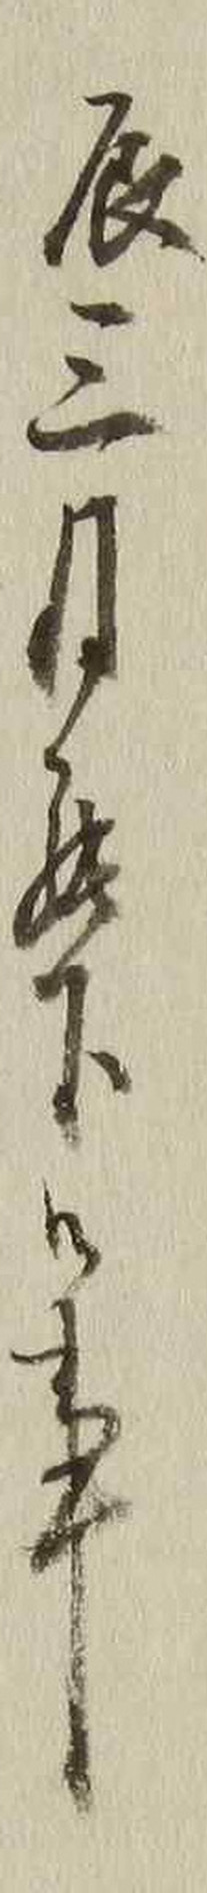辰三月罷下候事
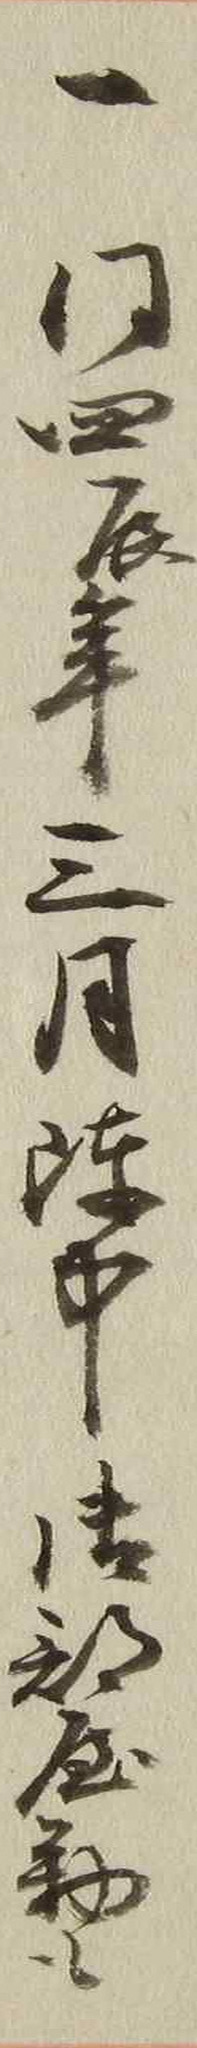一同四辰年三月陣中御部屋勤も
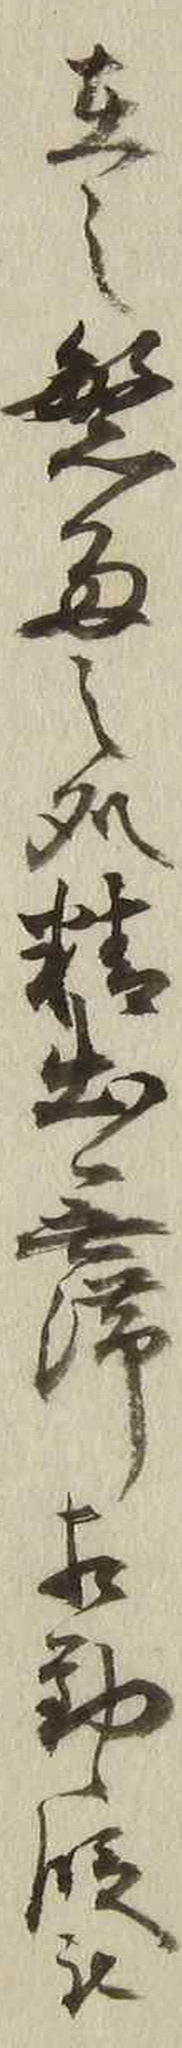在之繁多之処精出無滞相勤候段被
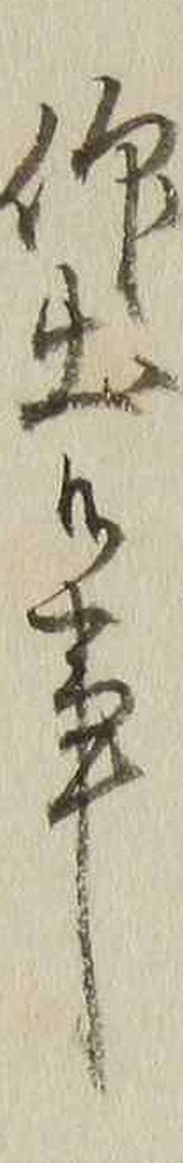仰出候事
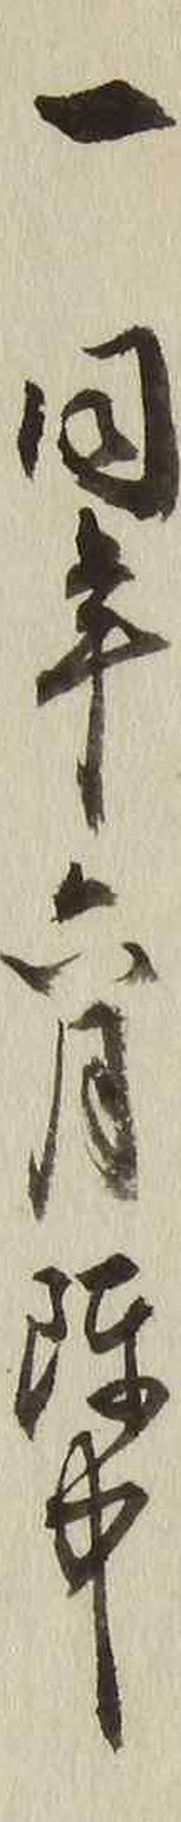一同年六月陣中
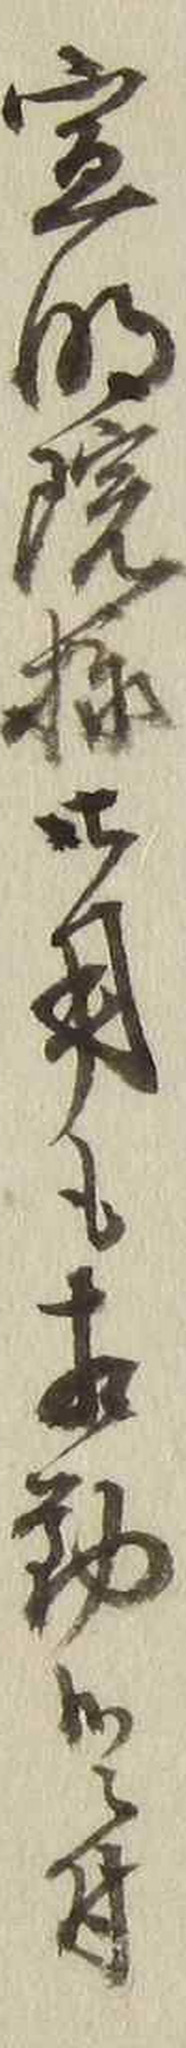宣明院様御用も相勤候ニ付
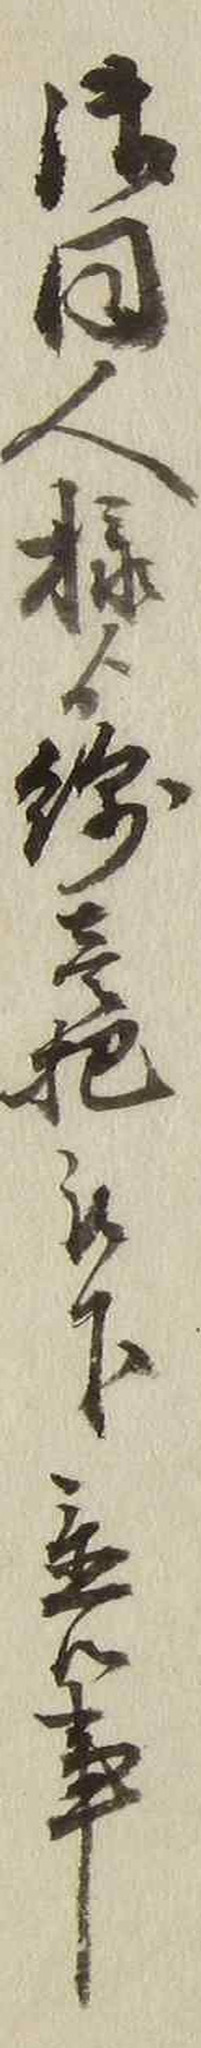御同人様ゟ綿壱把被下置候事
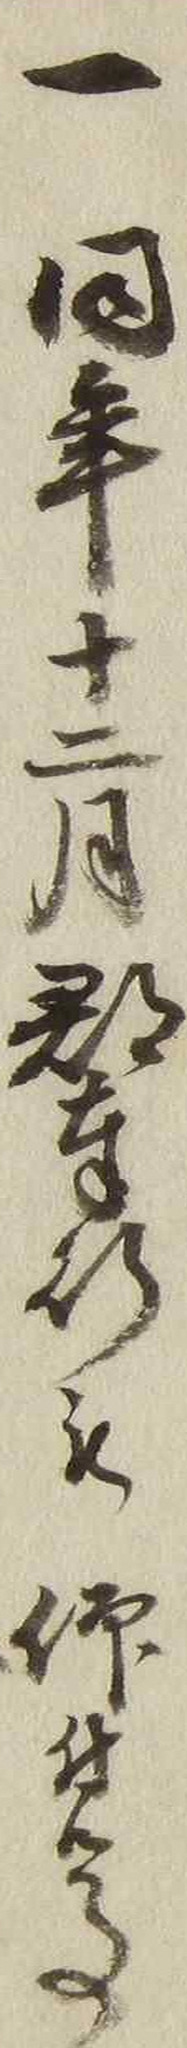一同年十二月郡奉行被仰付候事
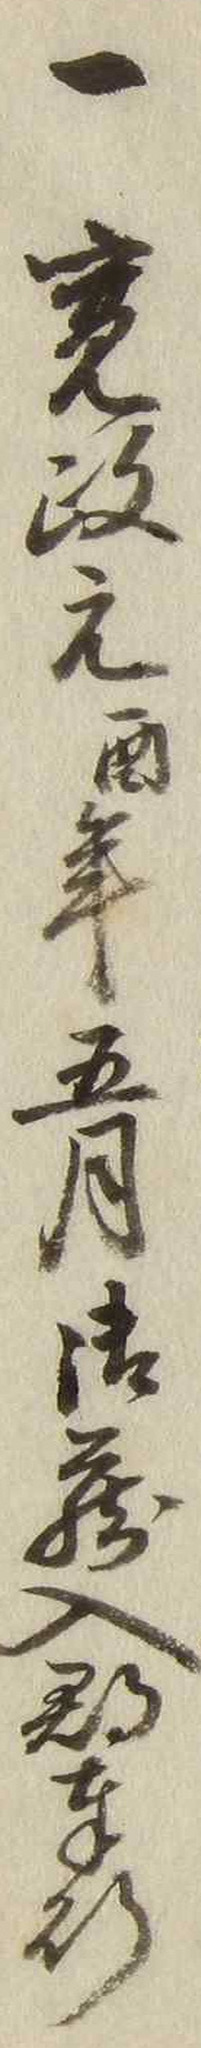一寛政元酉年五月御蔵入郡奉行

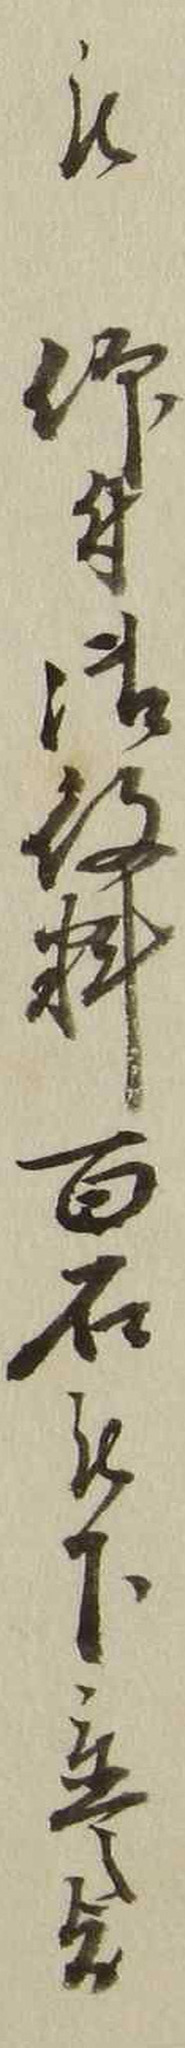被仰付御役料百石被下置之旨
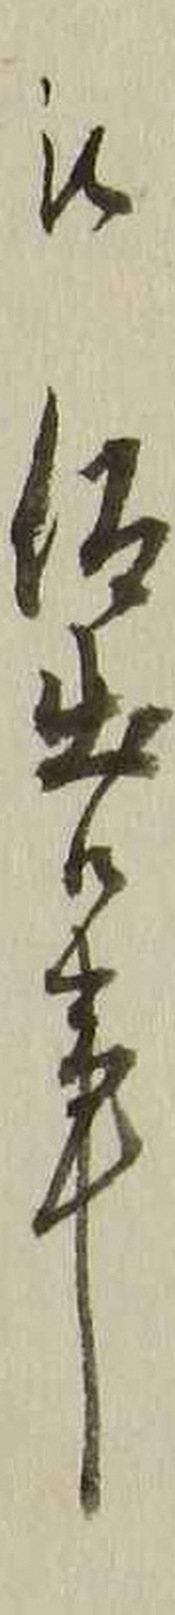被仰出候事
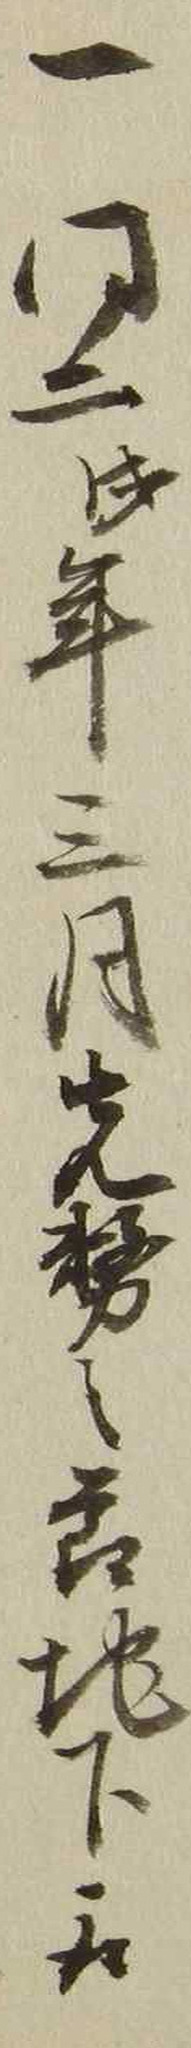一同二戊年三月先務之節地下取
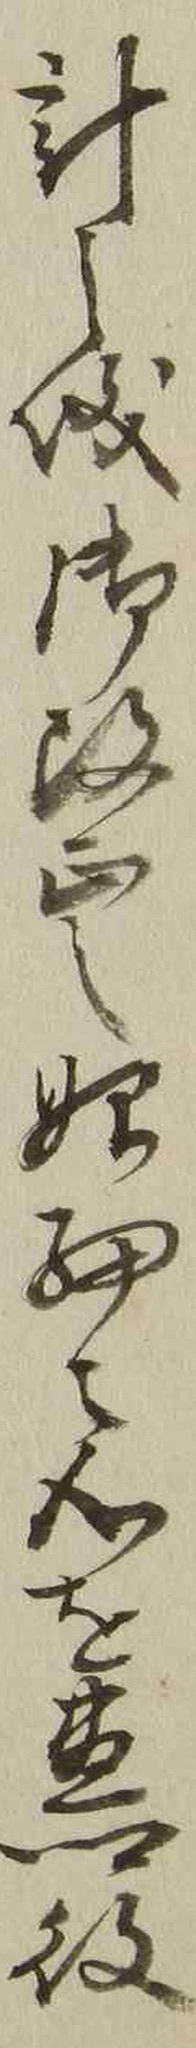計之儀御改正之始細々心を尽郷役
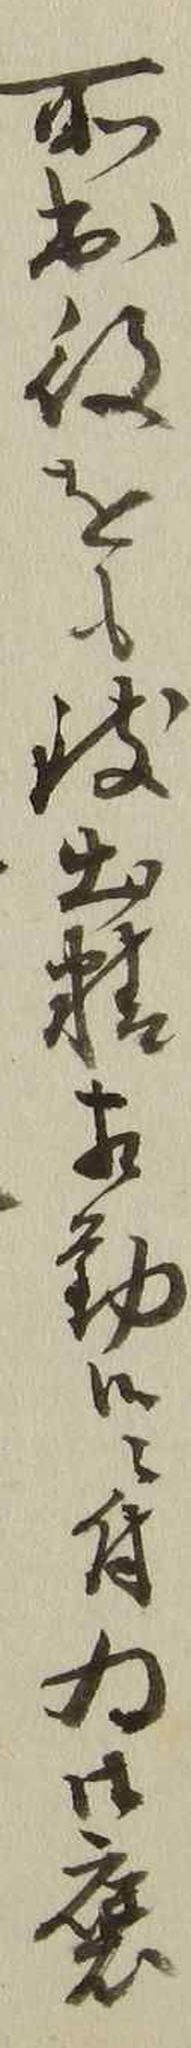所出役をも致出精相勤候ニ付為御褒
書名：諸士系譜　巻之23　い之部23
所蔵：会津若松市立会津図書館
